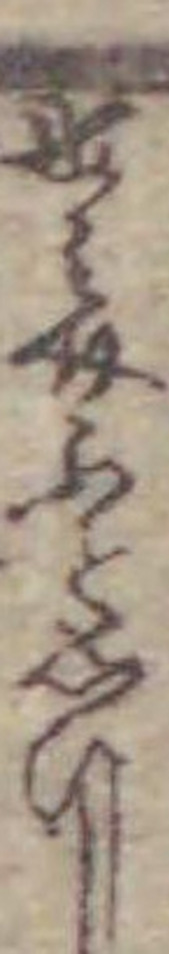世之介ふと思ひ
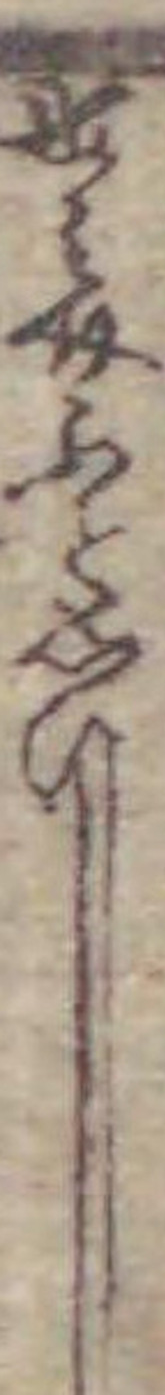世之介ふと思ひ
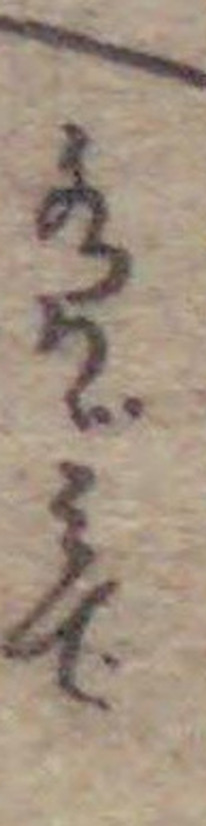水かゞみで
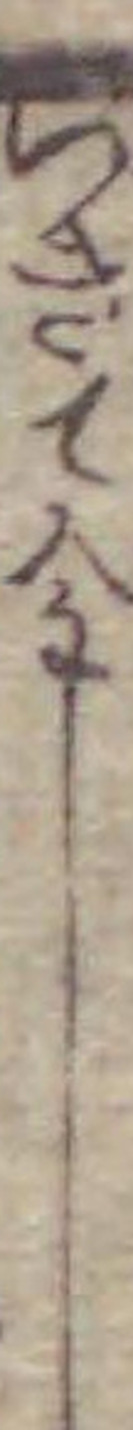つきて金
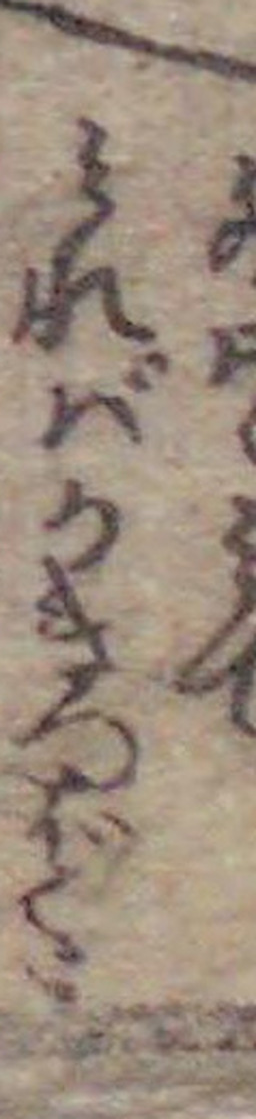みればかきつばた
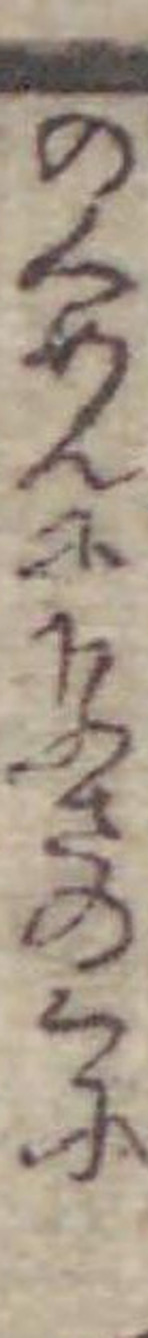のくめんに下ふさのくに
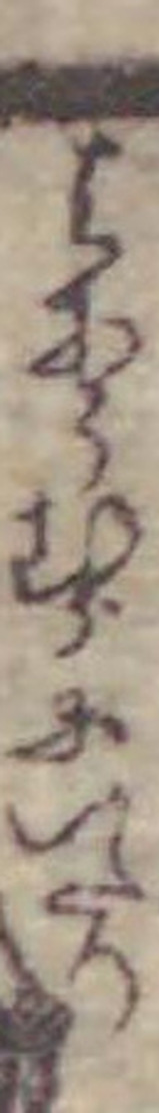はにうむらにいたり
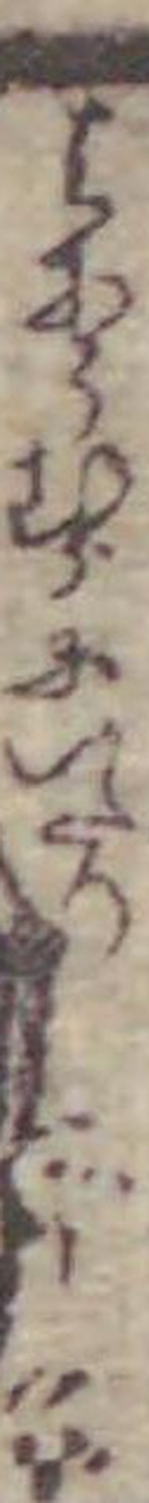はにうむらにいたり
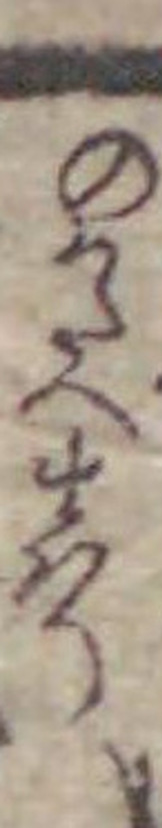のかたへまはり
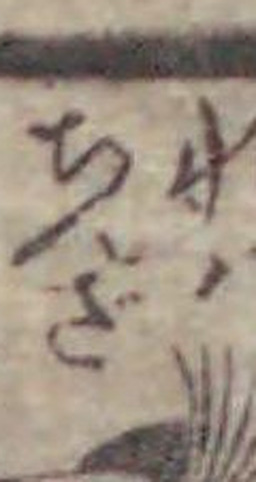ちんざ
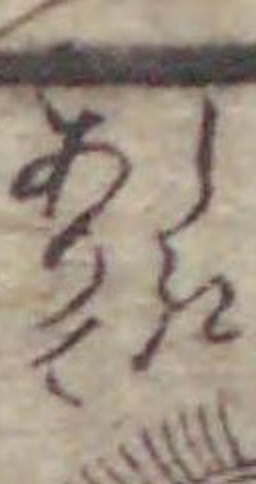ありて
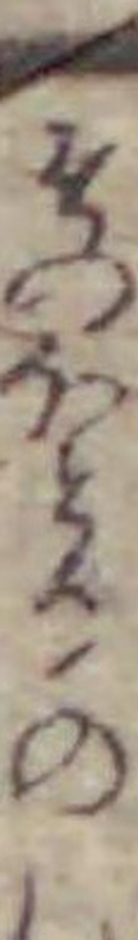そのほとりの
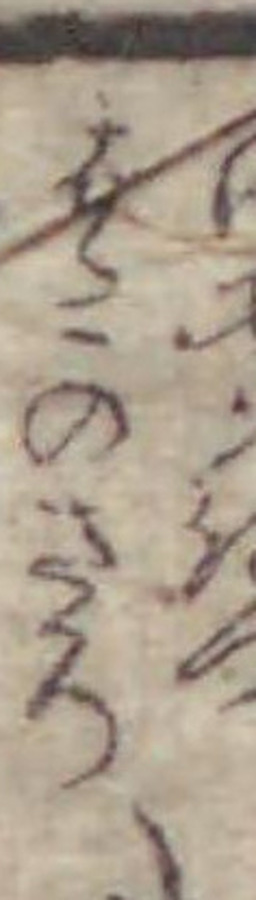はたのさかり
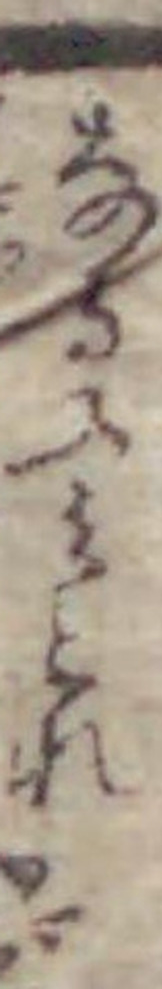なるにみとれ
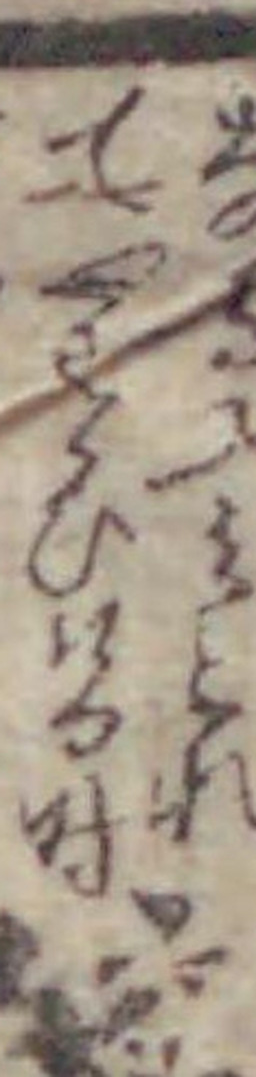てやすらひける時
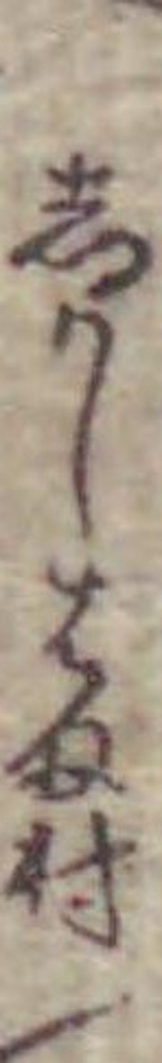しかしはま村
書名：嗚呼不侭世之助噺 : 3巻
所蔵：国立国会図書館 National Diet Library, JAPAN
